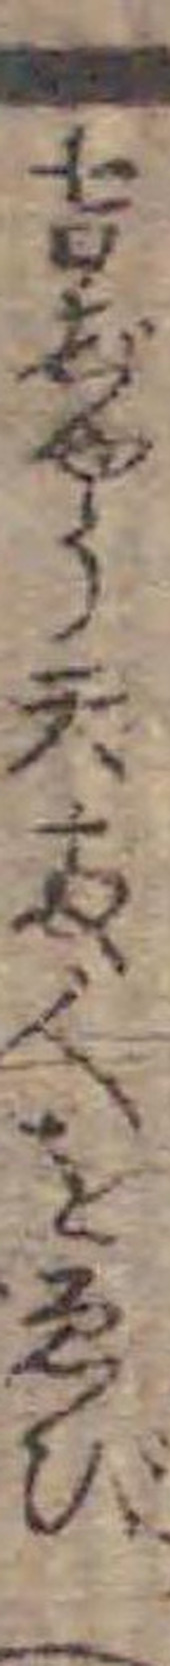吉じやう天両人をゑび
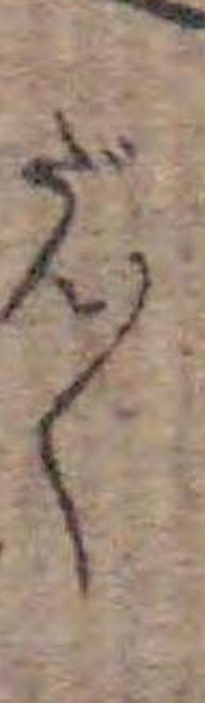だん〳〵
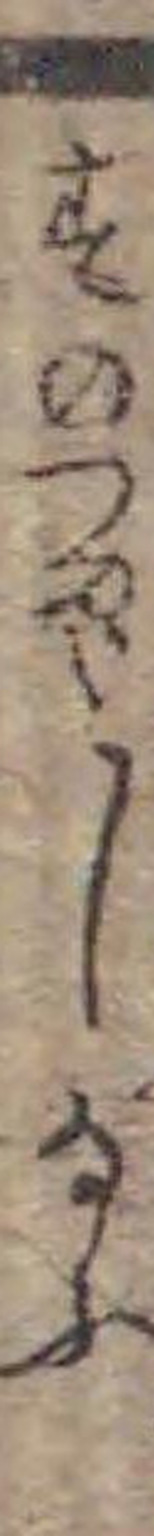すのつまとし給ふ
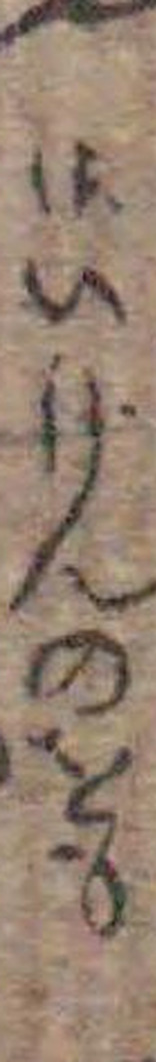御いけんのをも
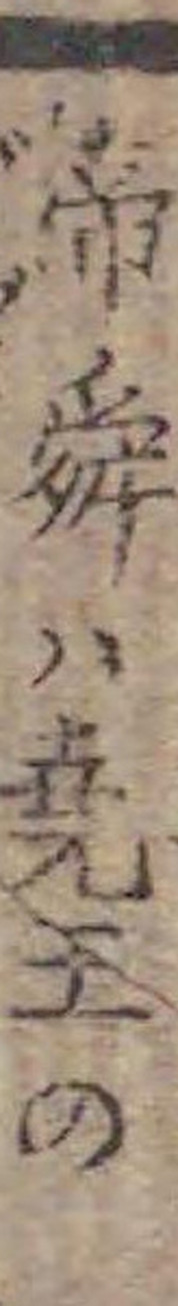帝舜は尭王の
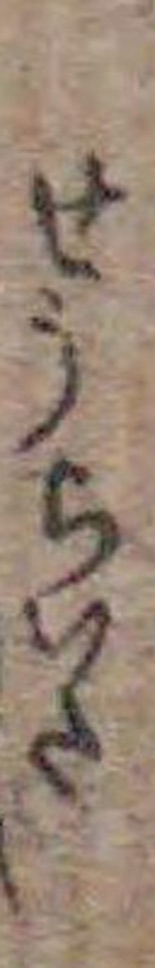せうちいたし
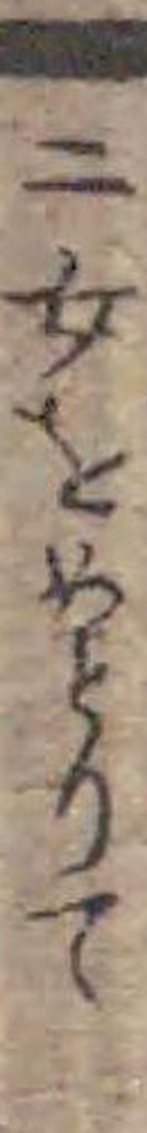二女をめとりて
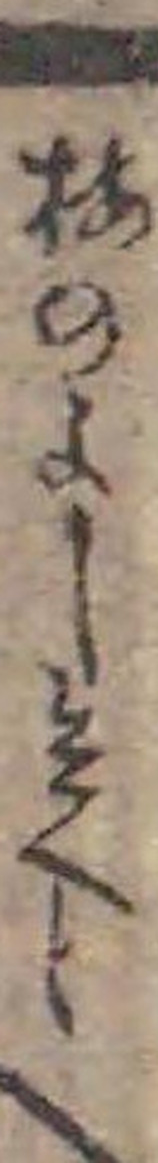梅のよし兵へと
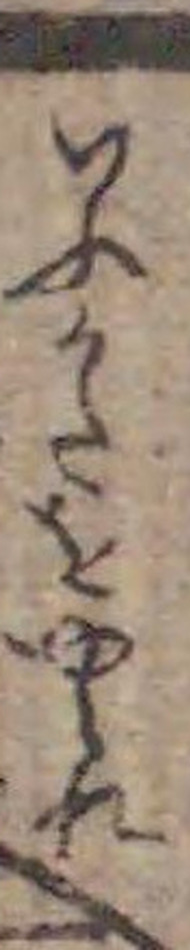いふかたをやられ
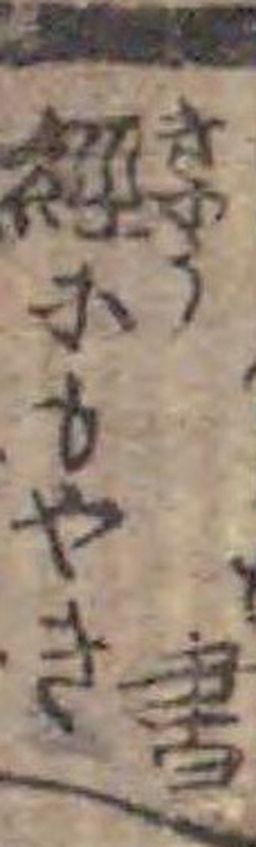経にもやき
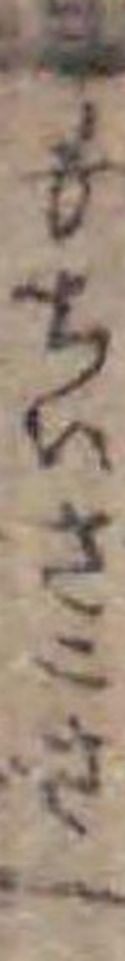もちいざこざ
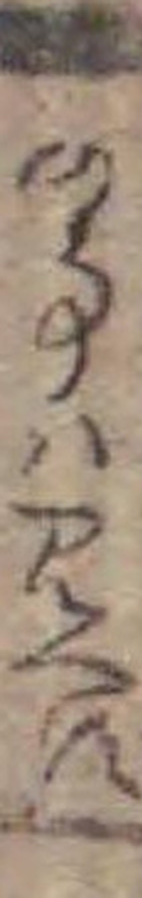の事は見へず
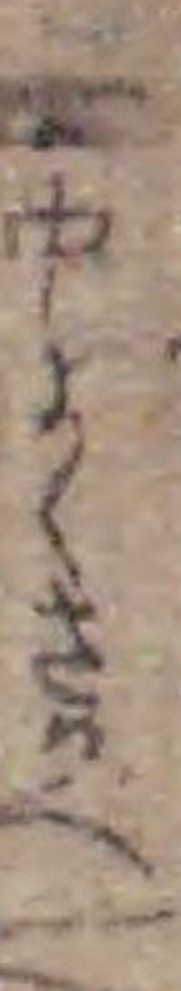中よくさかへ

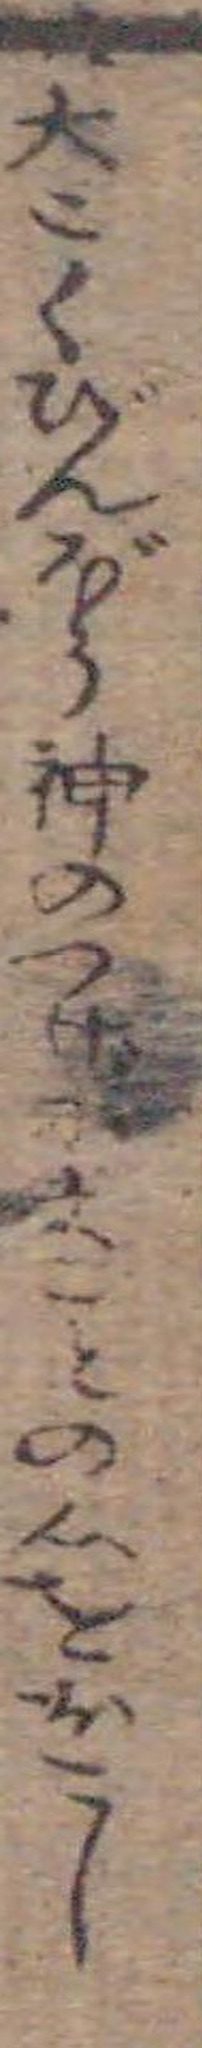大こくびんぼう神のつげにまことの心をおこし
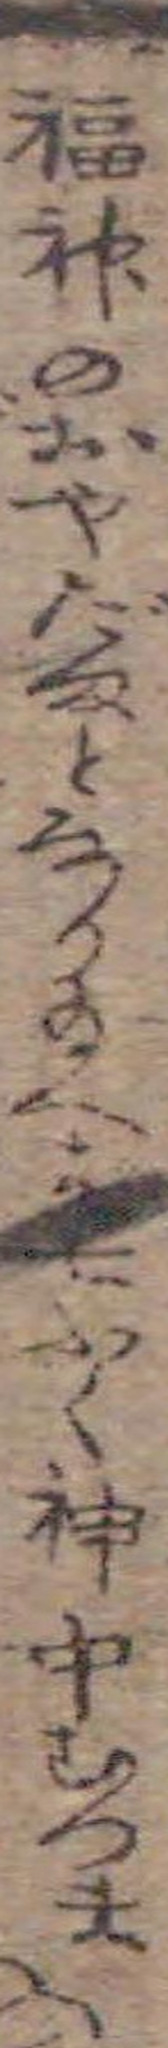福神のおやだまとなり給へば七ふく神の中むつま
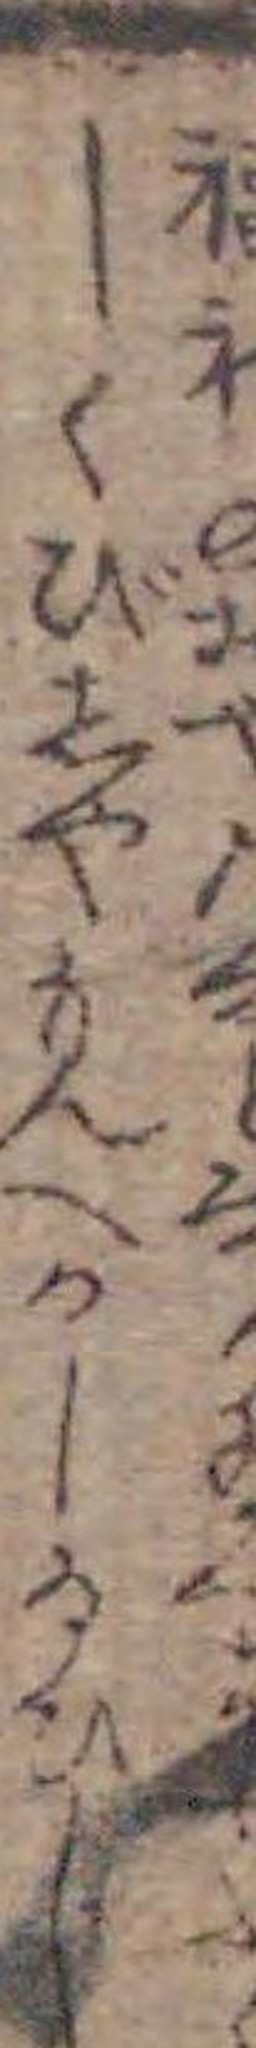しくびしやもんへかし給ひし
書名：蛭子大黒壮年過 : 2巻
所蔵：国立国会図書館 National Diet Library, JAPAN
